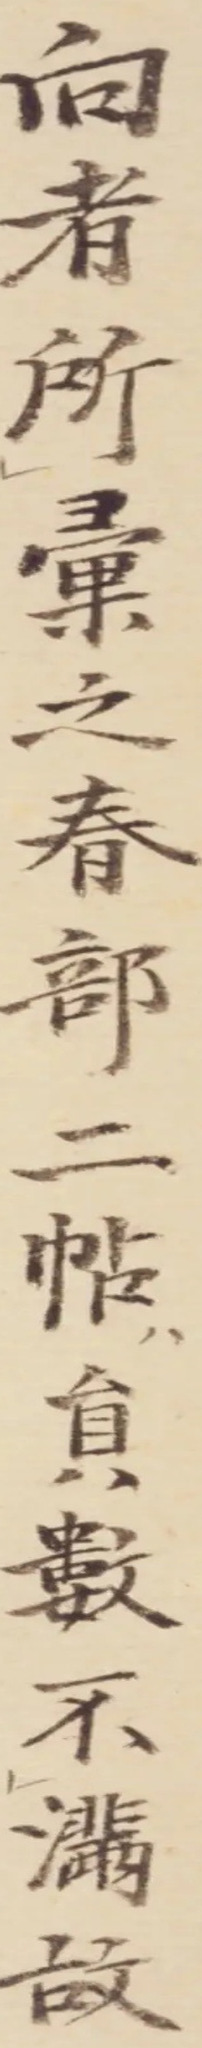向者所彙之春部二帖員数不故
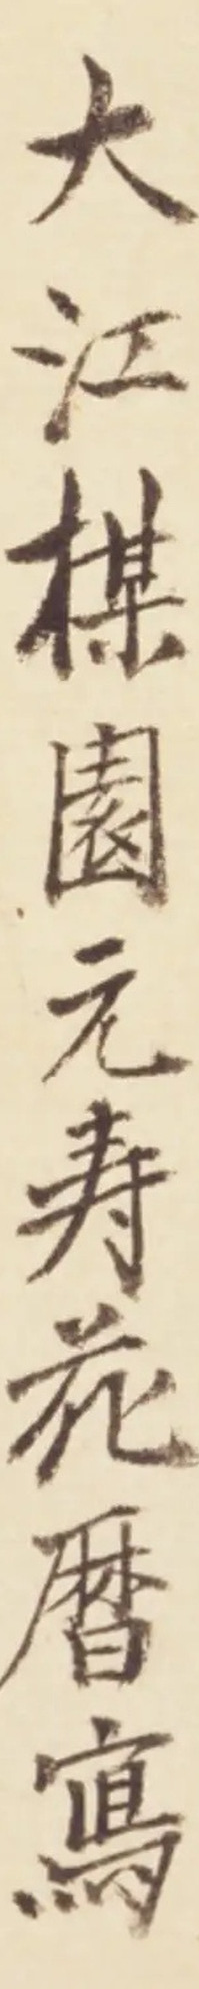大江楳園元寿花暦写

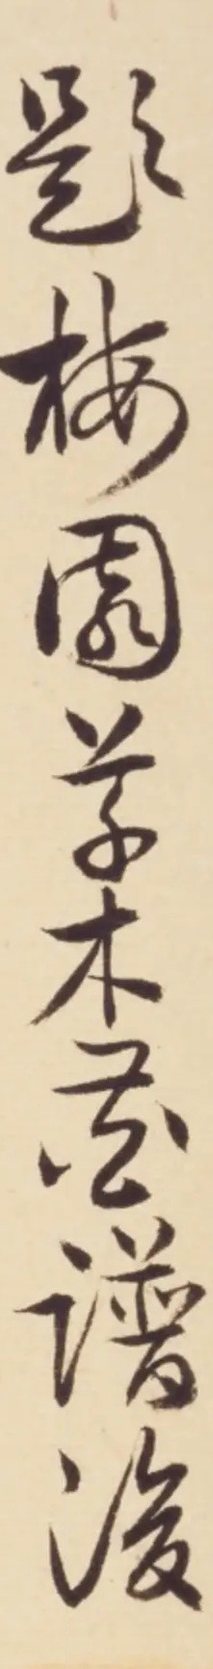題梅園草木図譜後
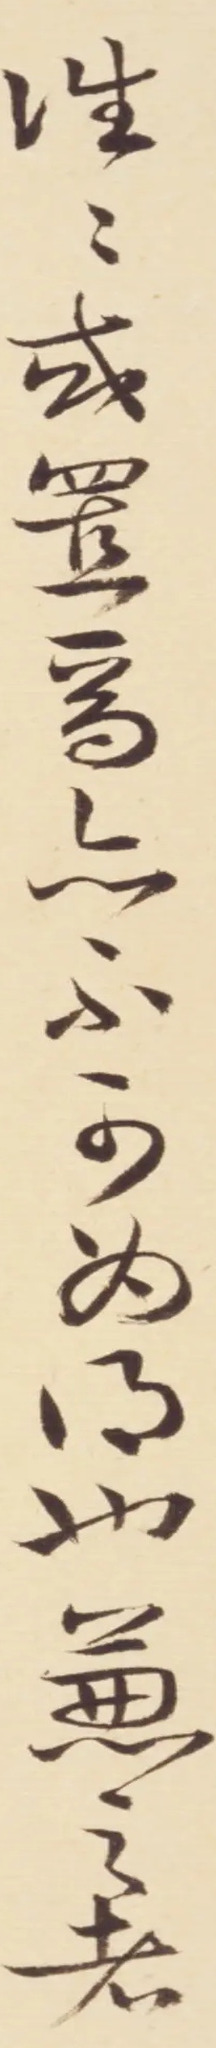往々或置焉今不可為得助兼之者
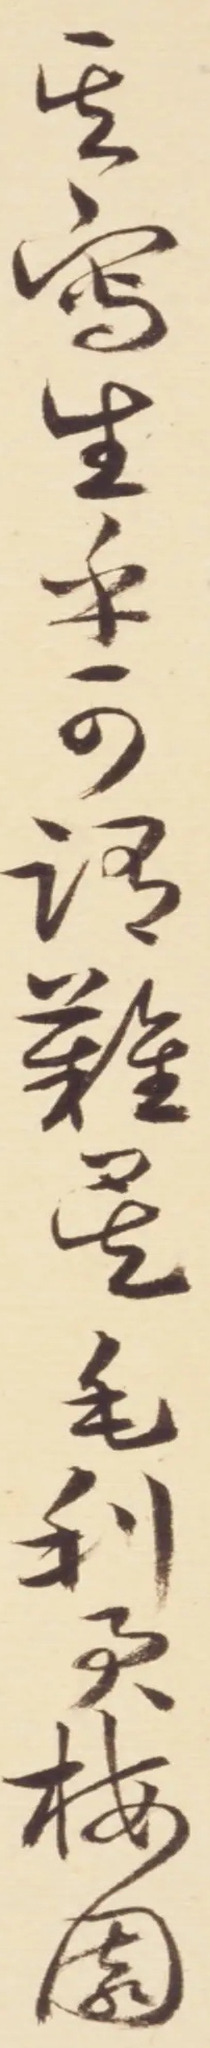其写生乎可得難毛利恵梅園
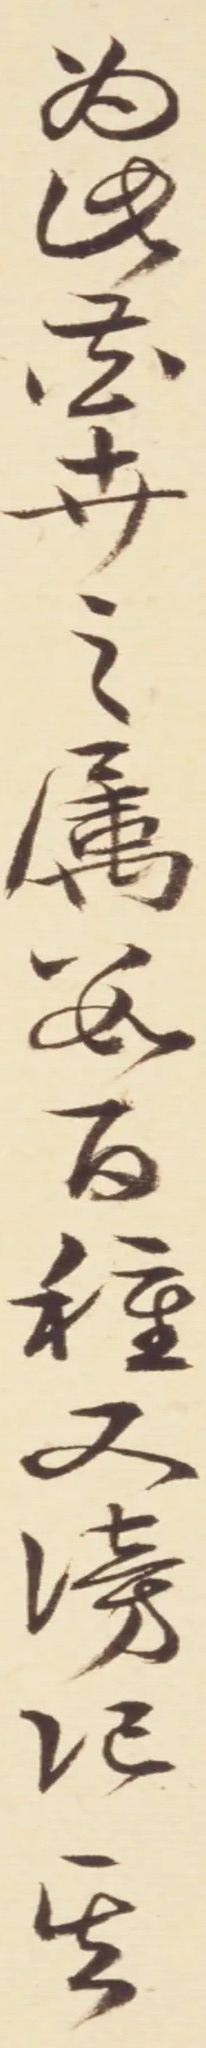為此花卉之属数百種又傍記其
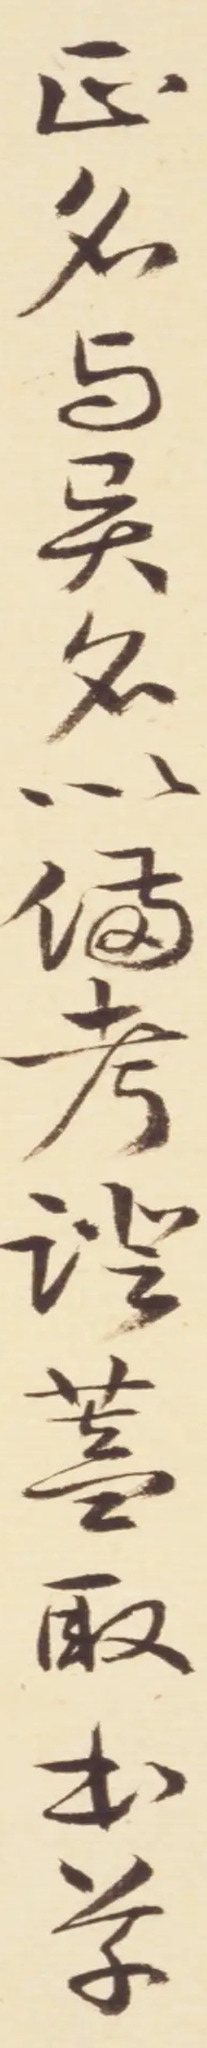正名与異名以備考證蓋取本草
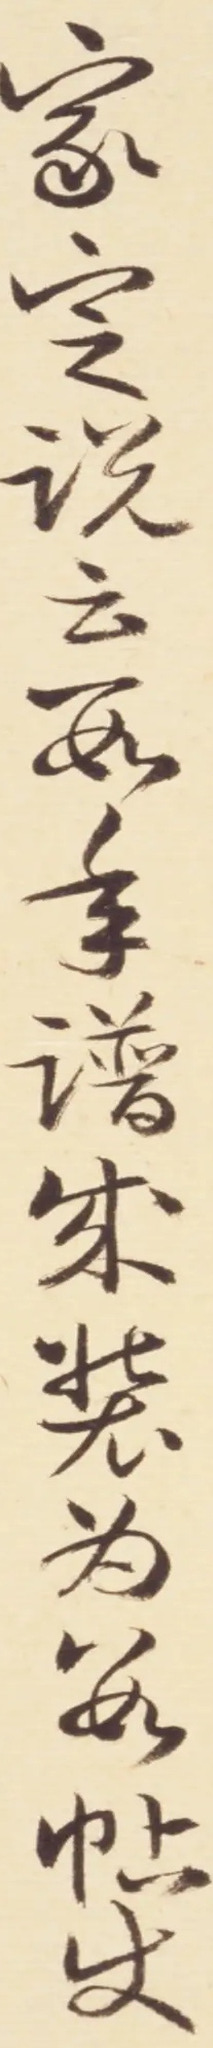家定説云数年譜成装為数帖使
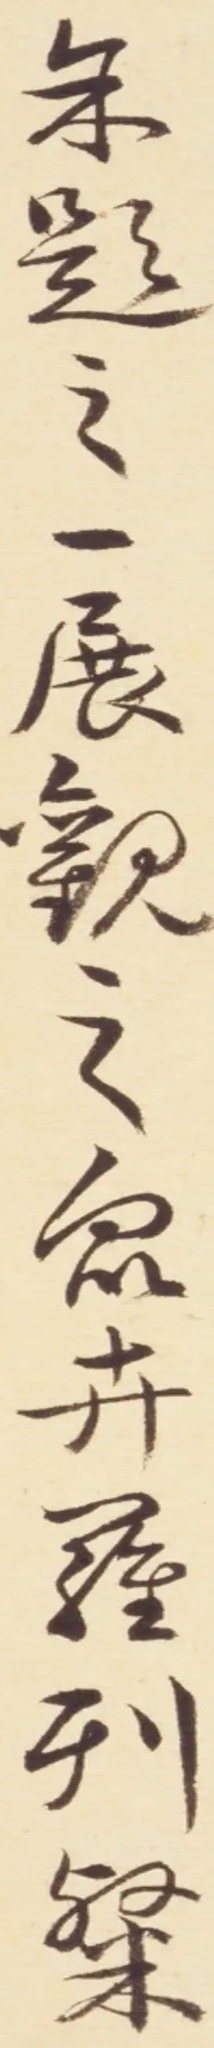余題之一展観之衆卉羅列燦
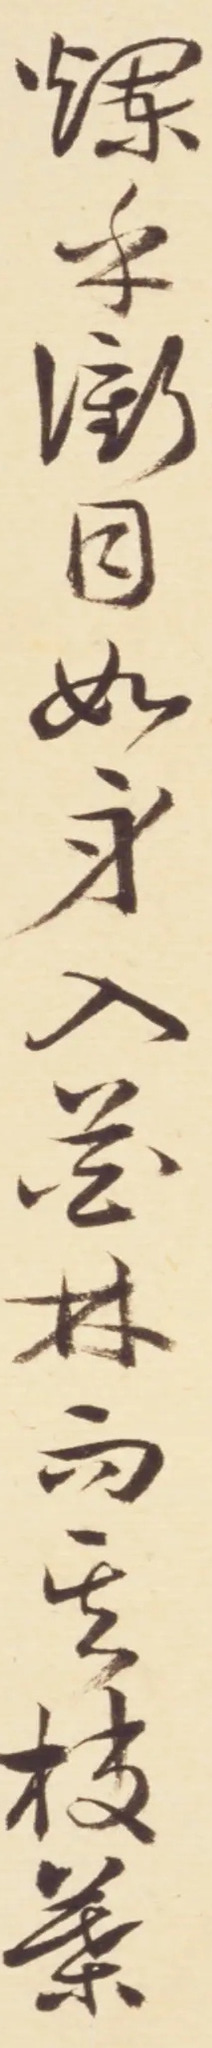爛乎働目如身入花林而其枝葉
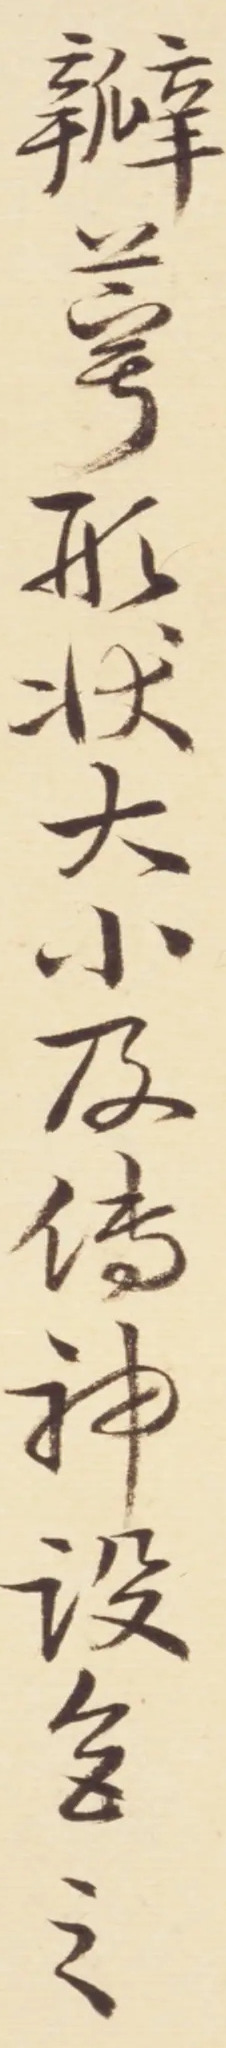辨萼形状大小及傳神設色之
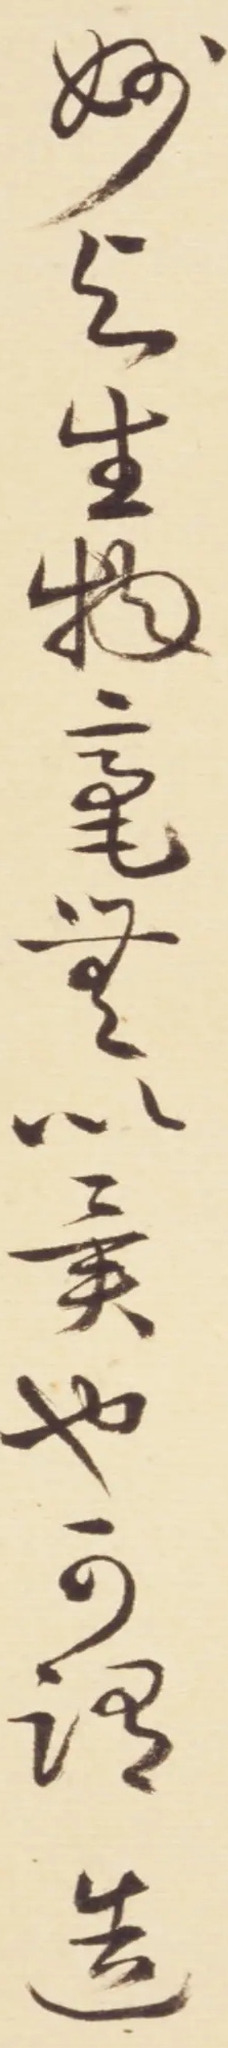妙与生物毫無以矣也可謂造
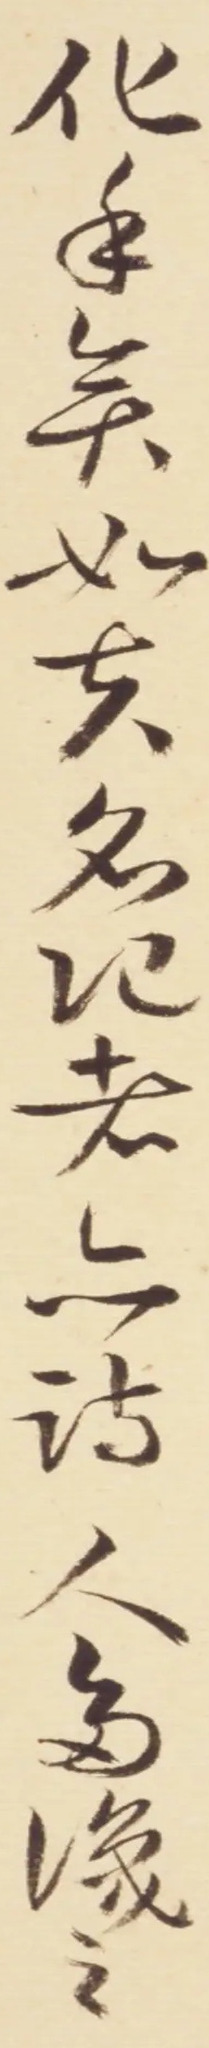化手如夫名記者今待人多之
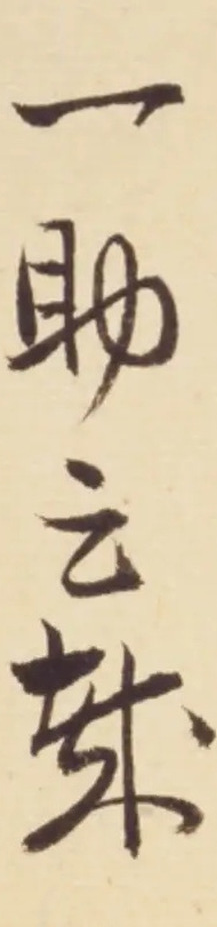一助云成
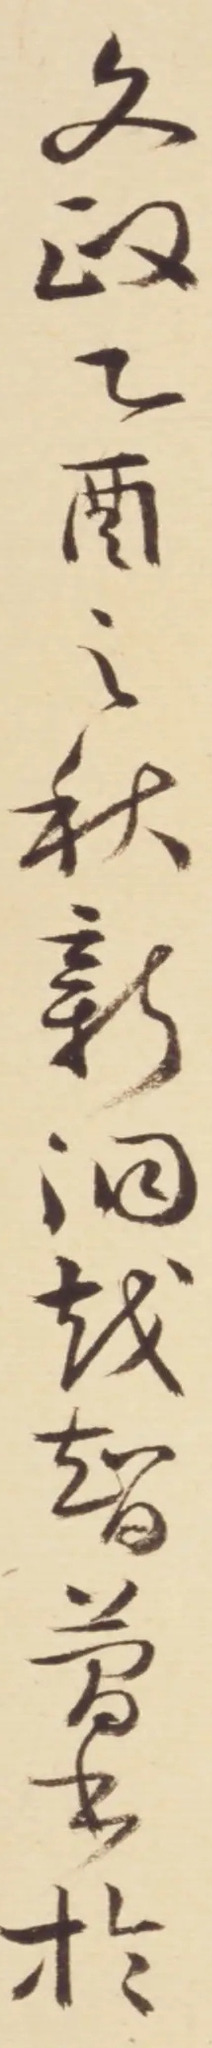文政乙酉之秋新洞越智書於
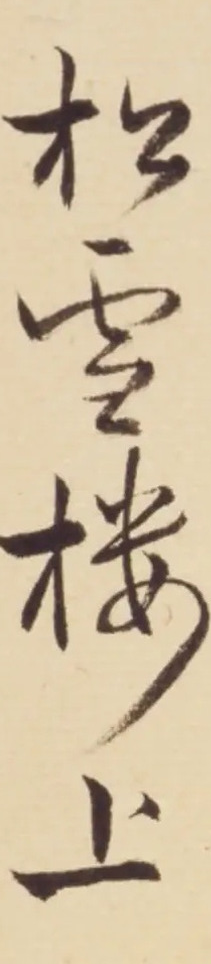松雪楼上
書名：梅園草木花譜冬之部
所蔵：国立国会図書館 National Diet Library, JAPAN
